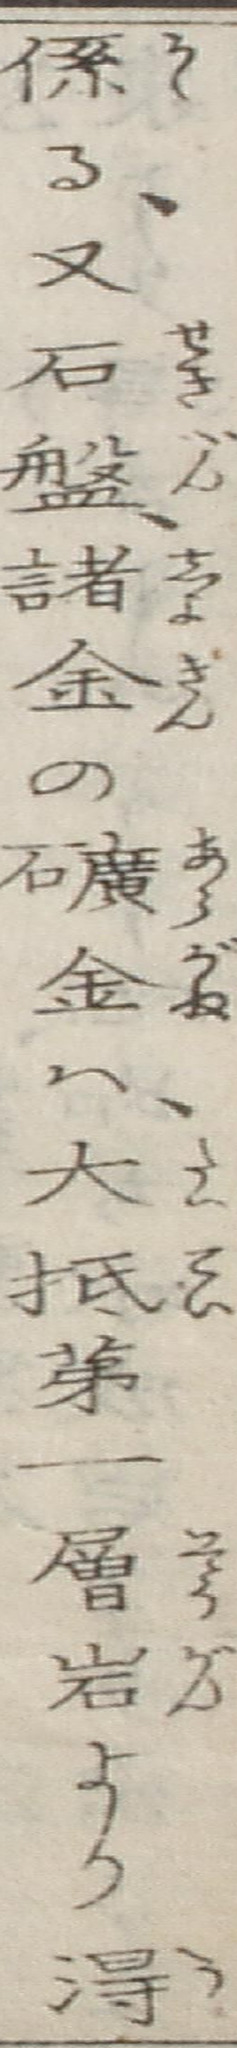係る、又石盤、諸金の鉱金は、大抵第一層岩より得
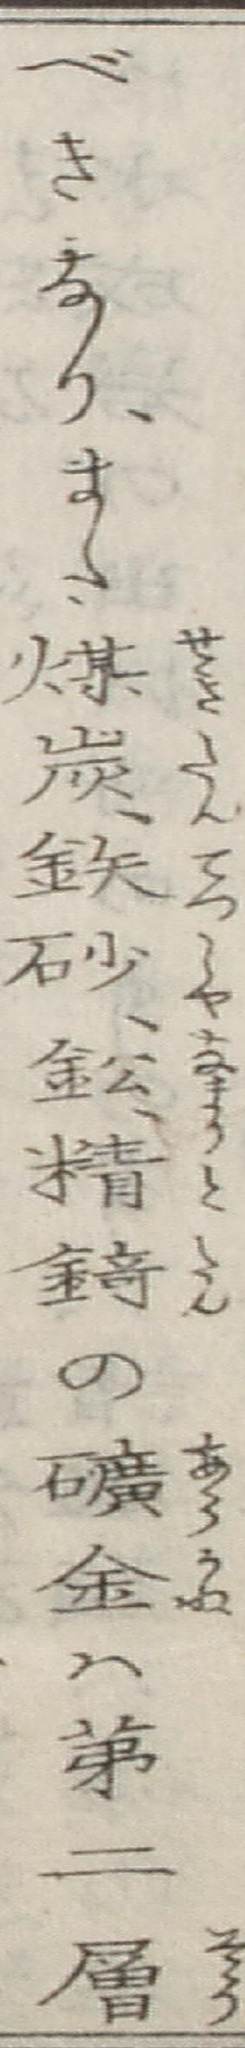べきなり、また煤炭、鉄砂、鉛、精錡の鉱金は第二層
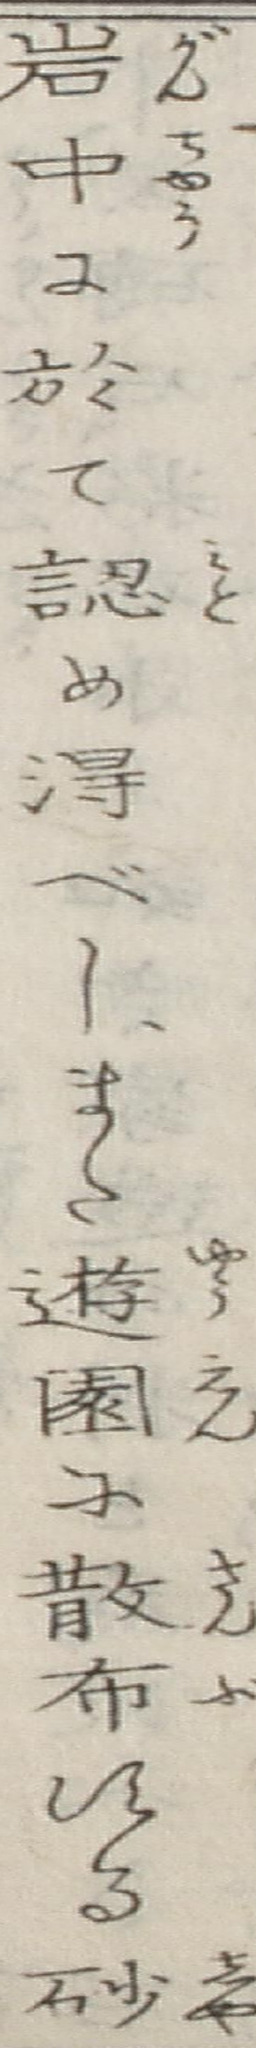岩中に於て認め得べし、また遊園に散布する砂
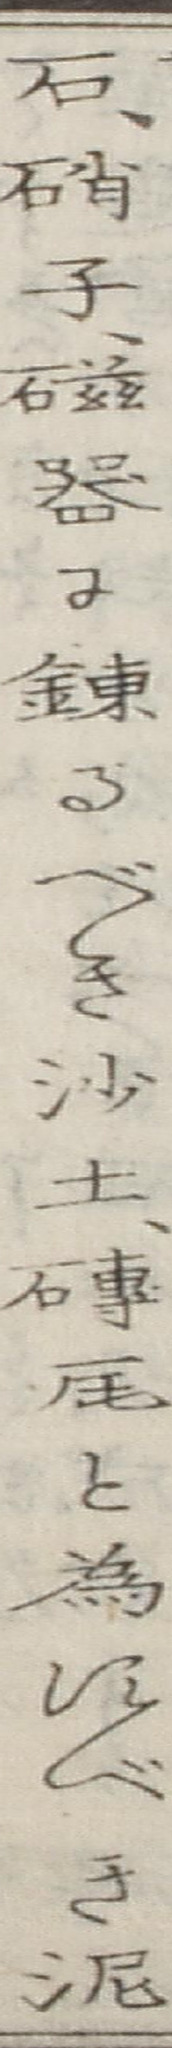石、硝子、磁器に錬るべき沙土、磚瓦と為すべき泥
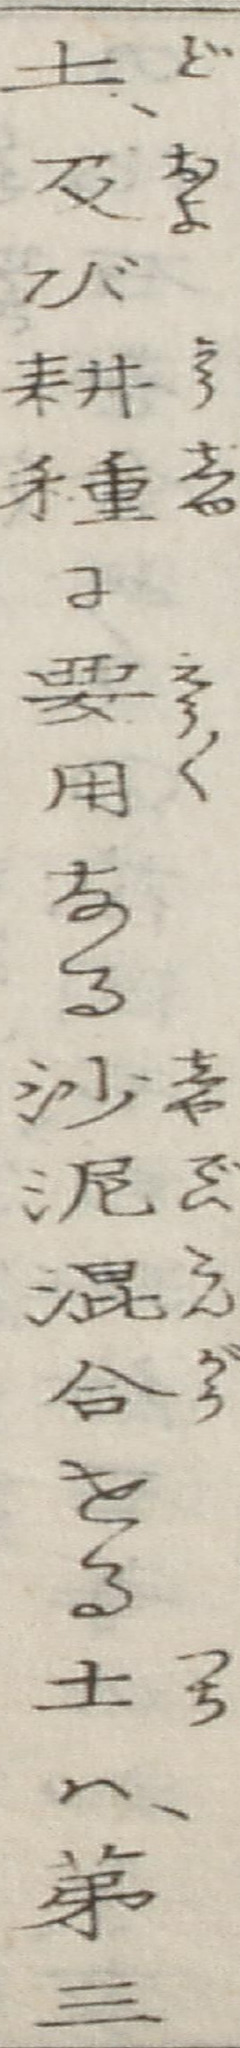土、及び耕種に要用なる沙泥混合せる土は、第三
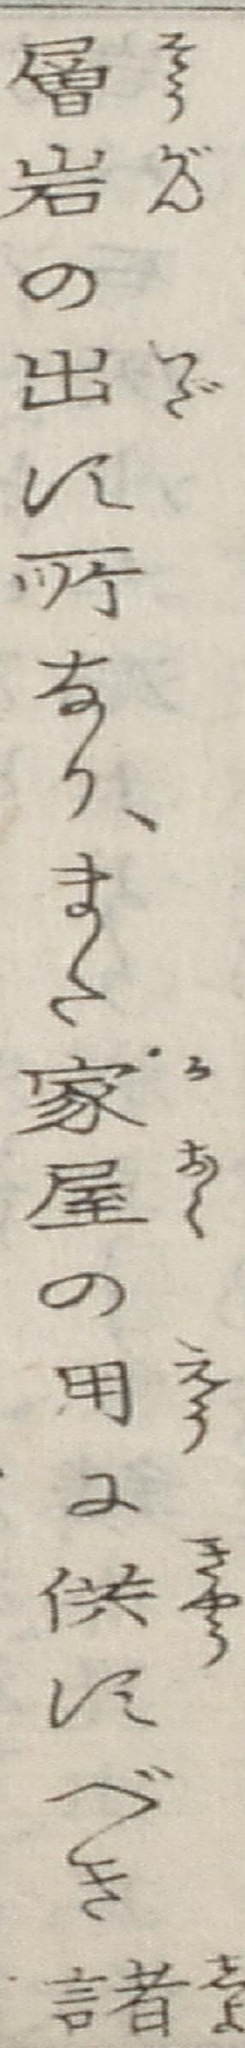層岩の出す所なり、また家屋の用に供すべき諸
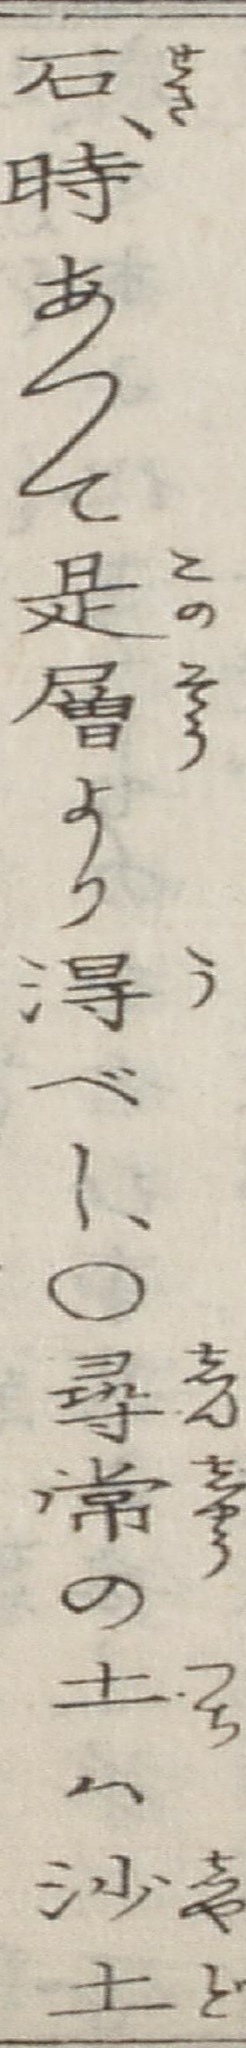石、時あつて是層より得べし、〇尋常の土は沙土
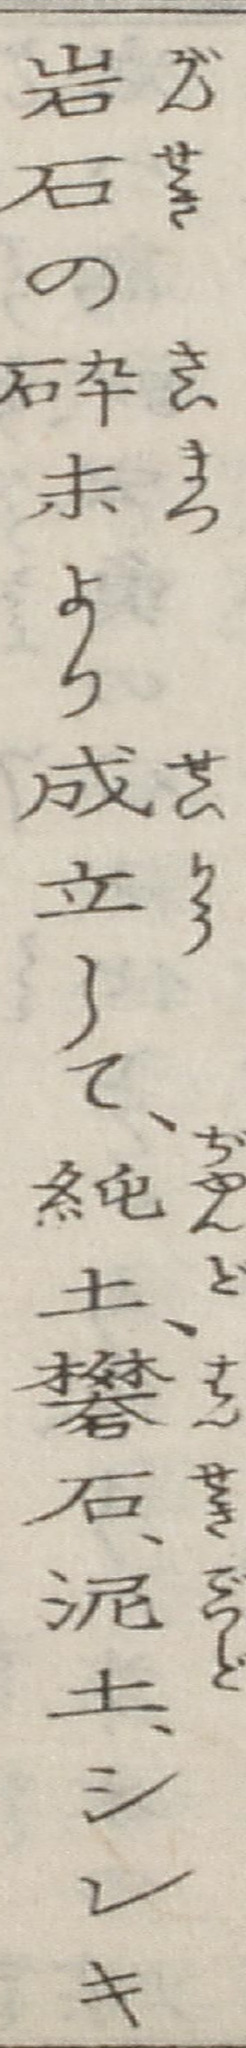岩石の砕末より成立して、純土、礬石、泥土、シレキ
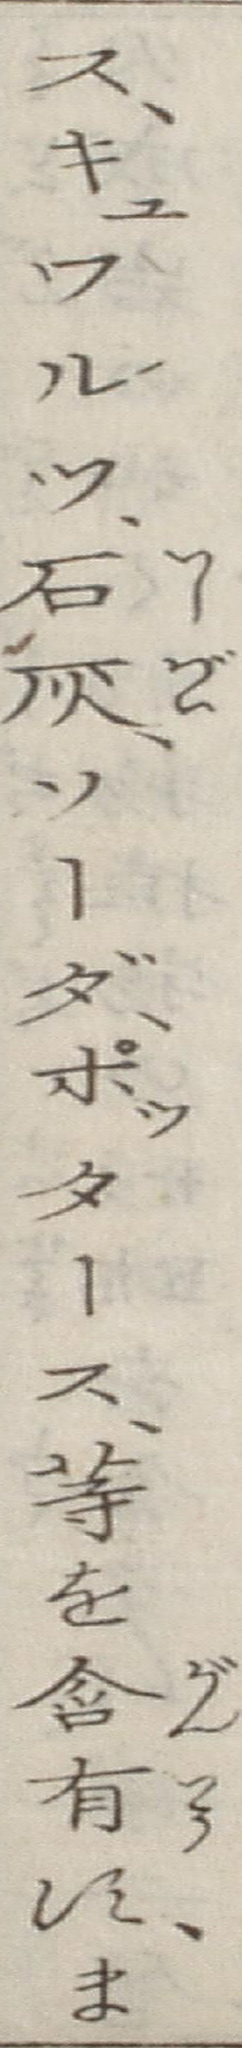ス、キュワルツ、石灰、ソーダ、ポッタース、等を含有す、ま
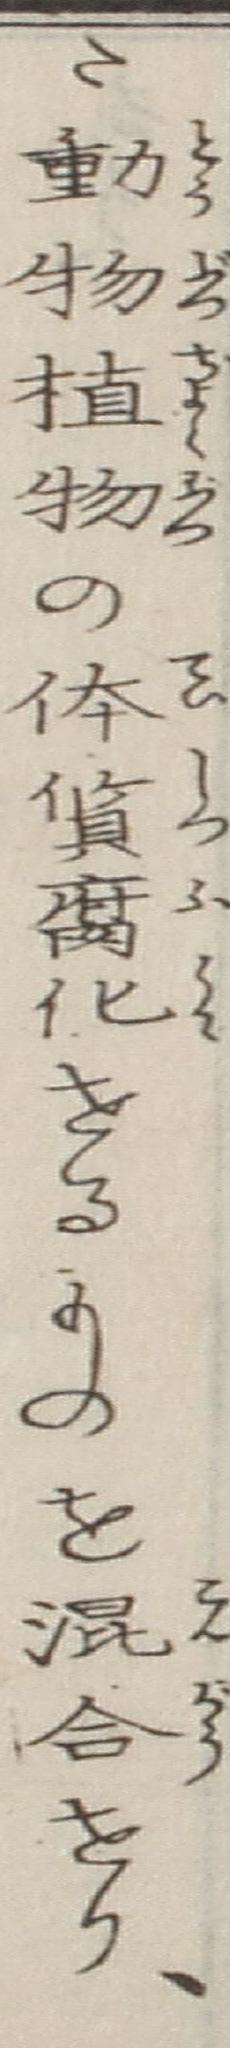た動物植物の体質腐化せるものを混合せり、
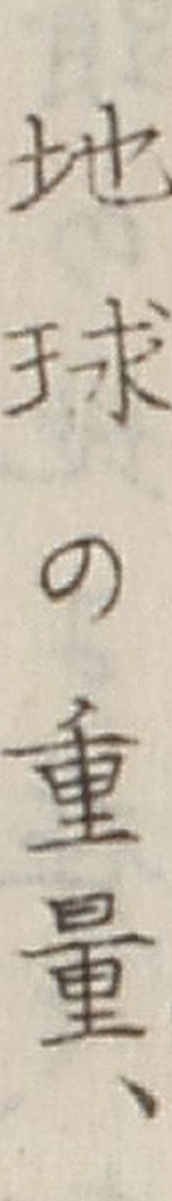地球の重量、
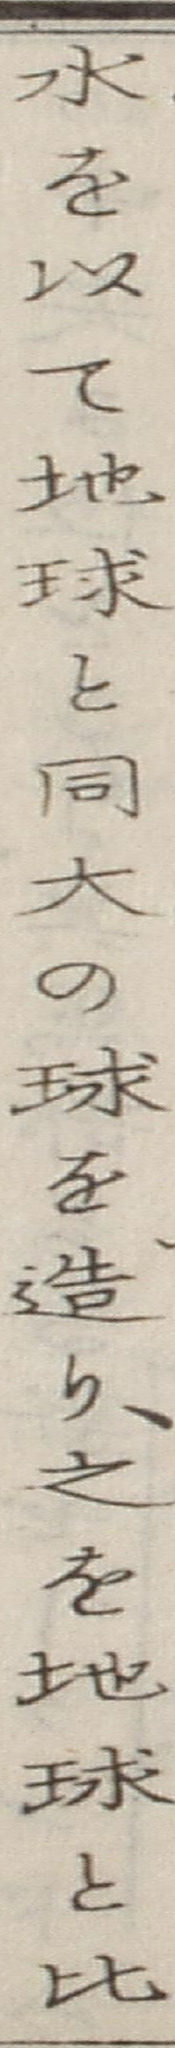水を以て地球と同大の球を造り、之を地球と比
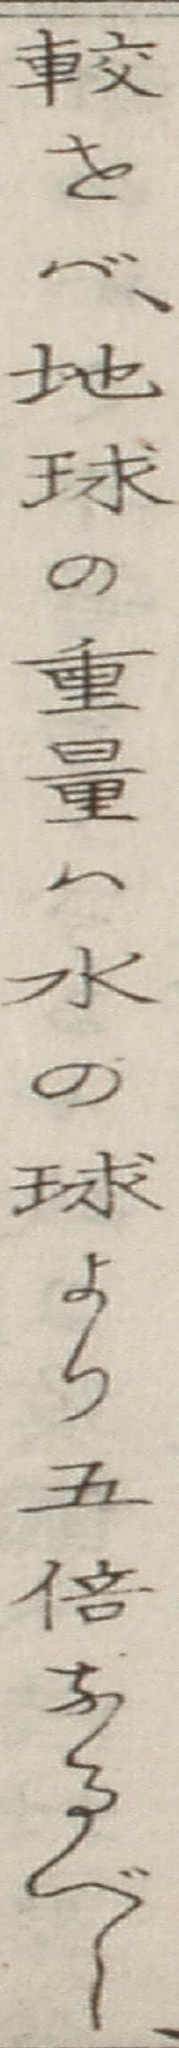較せば、地球の重量は水の球より五倍なるべし、
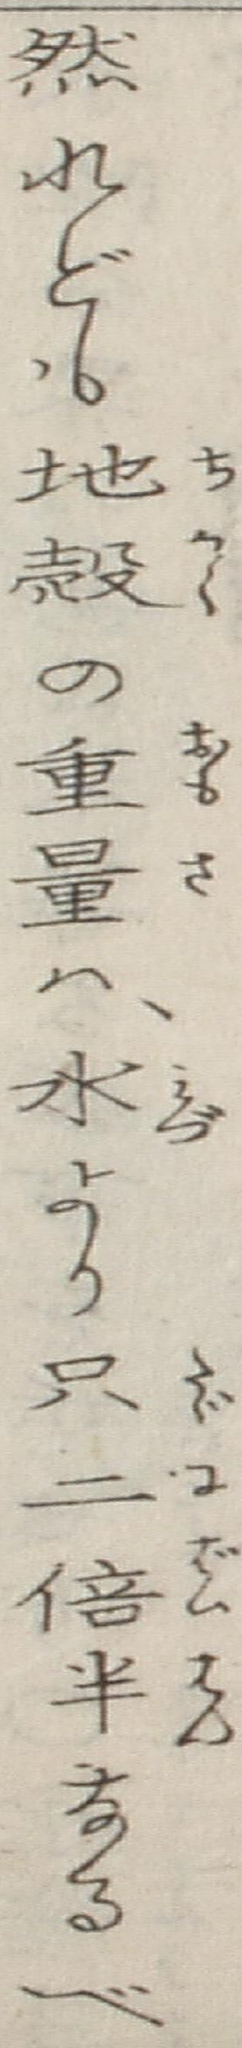然れども地殻の重量は、水より只二倍半なるべ
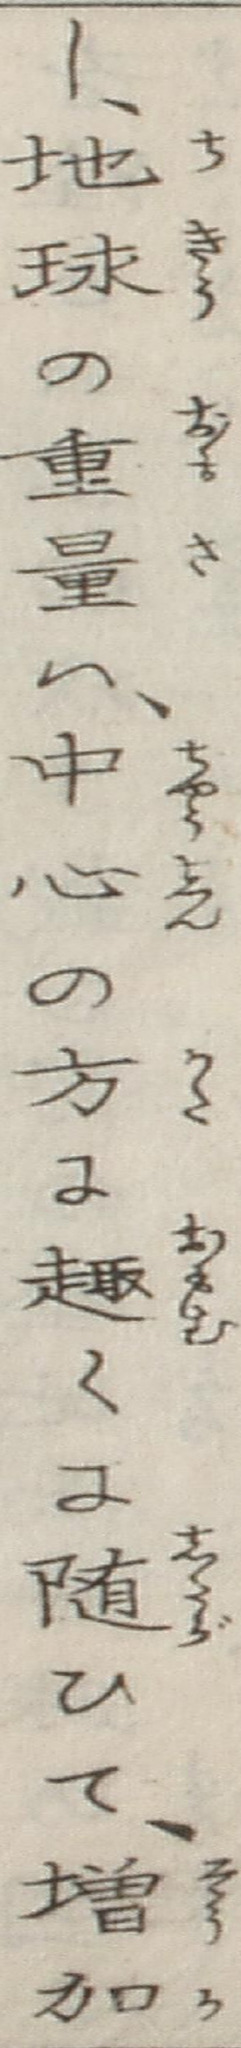し、地球の重量は、中心の方に趣くに随ひて、増加
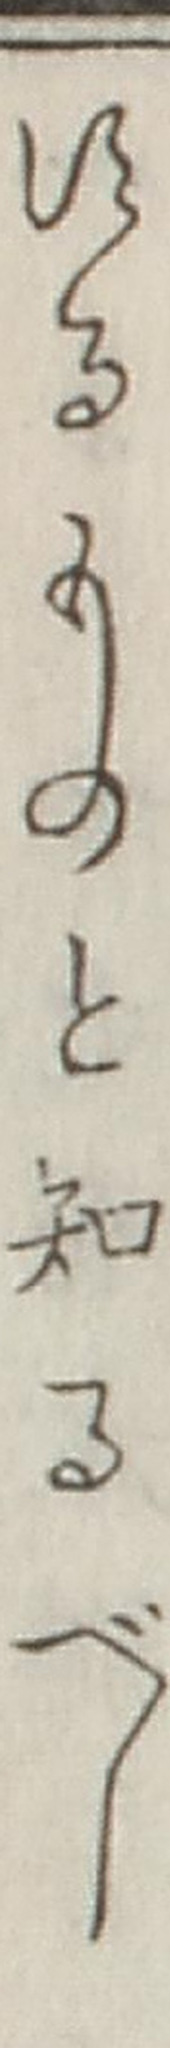するものと知るべし
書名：訓蒙　天然地理學　上
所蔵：東京大学地震研究所図書室 Earthquake Research Institute Library, The University of Tokyo, JAPAN
